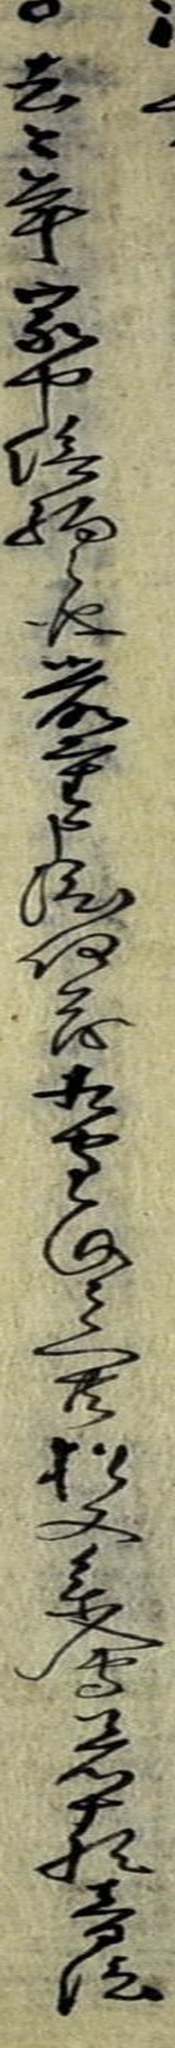〇去々年家中倹約之儀厳重申渡何茂相守候趣ニ候へ共猶又集会着類音信
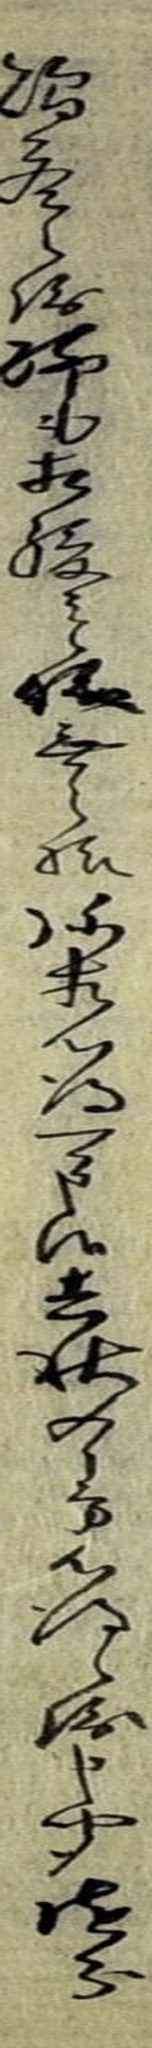贈答之儀聊も相緩ミ候儀無之様弥相心得可申候去秋〆り方心得候儀申聞随分
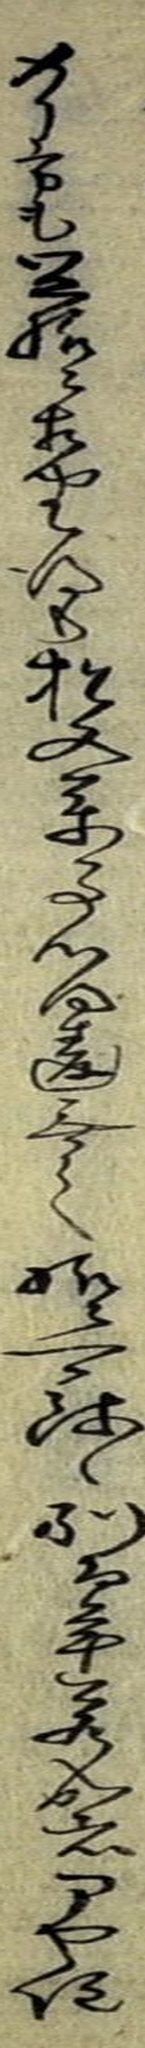〆り方も宜様ニ相聞候得共猶又万事心得違無之様ニ可致候別而年若成者部屋住
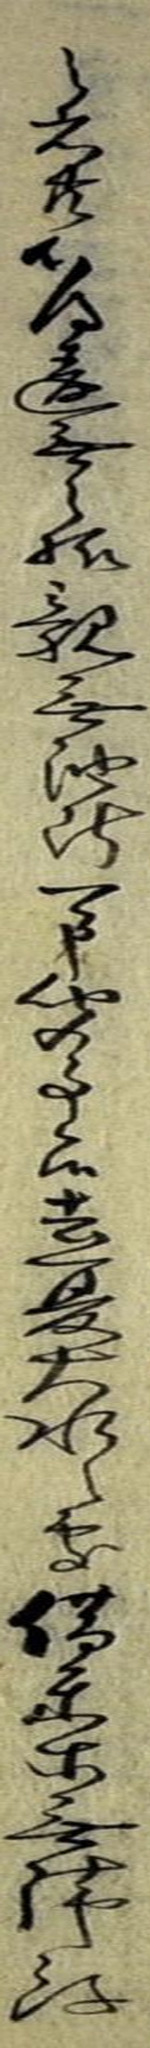之者共心得違無之様親無油断可申聞事ニ候去夏大水之処借米等無滞致
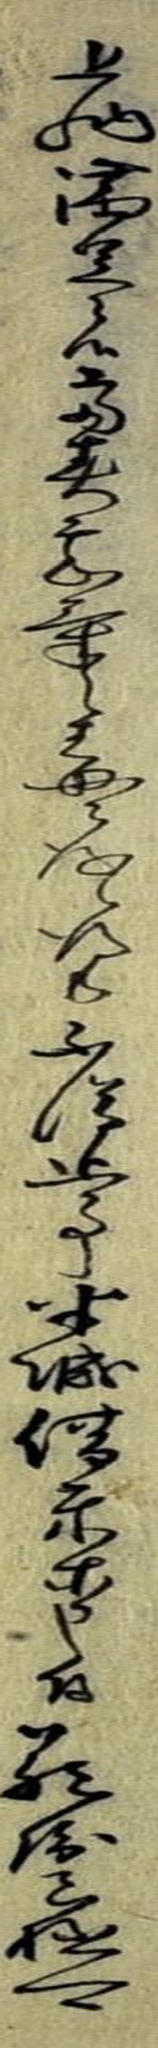上納満足ニ候当春甚気之毒ニ存候得共不得止事半減借米等申付難儀至極可
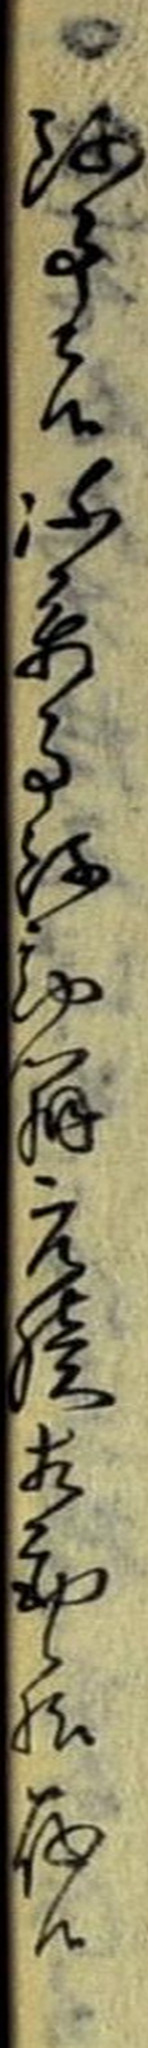致事ニ候弥万事致勘弁取続相勤候様存候
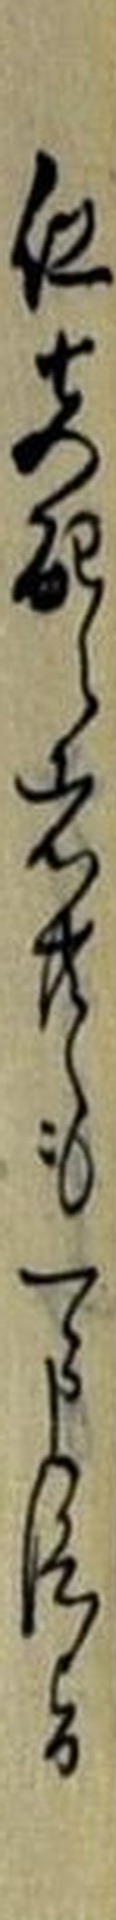但支配之者共へも可申渡旨
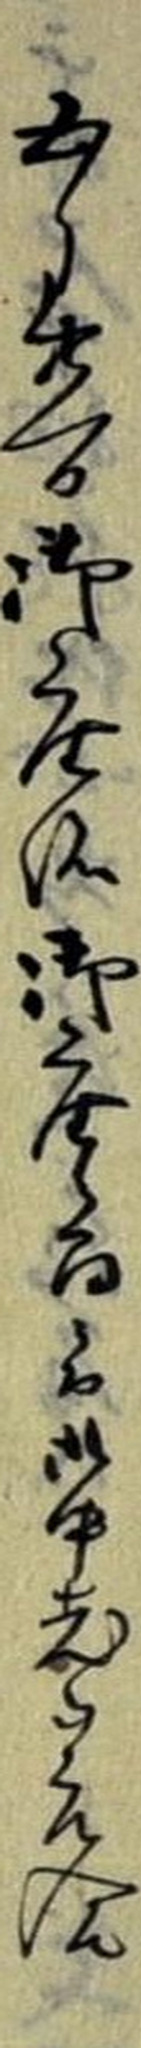五月廿一日御座所御座之間ニ而御中老御取合
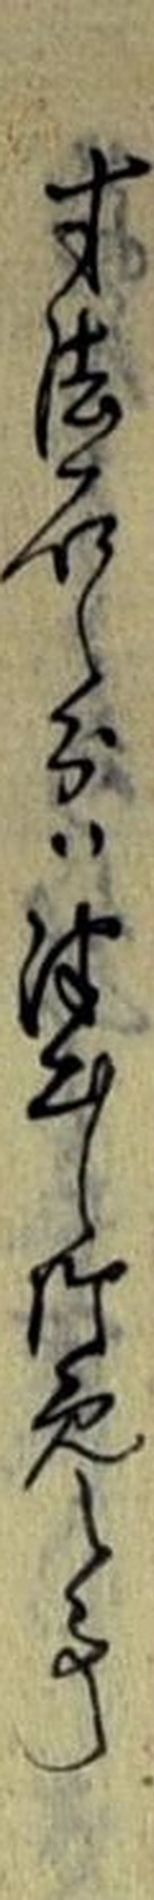寸法石之分ハ津出し御免之事
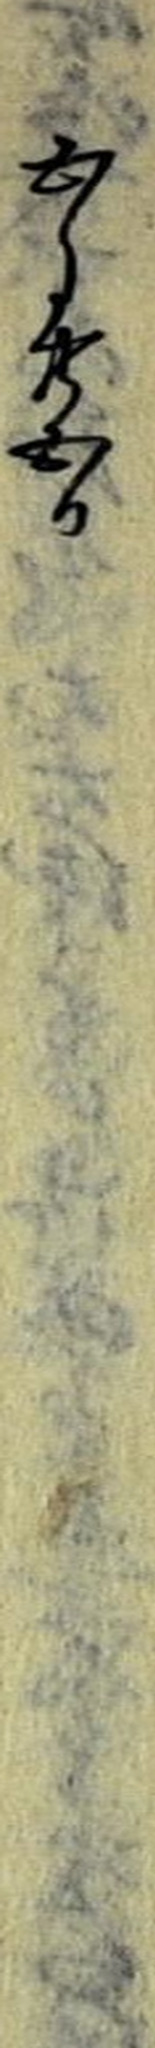五月廿五日
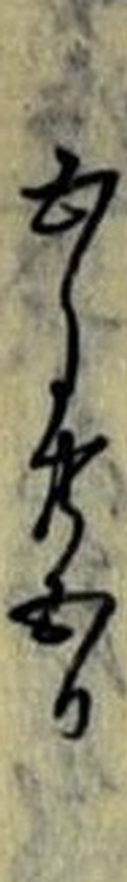五月廿五日
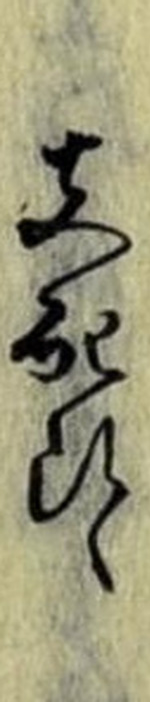支配頭へ
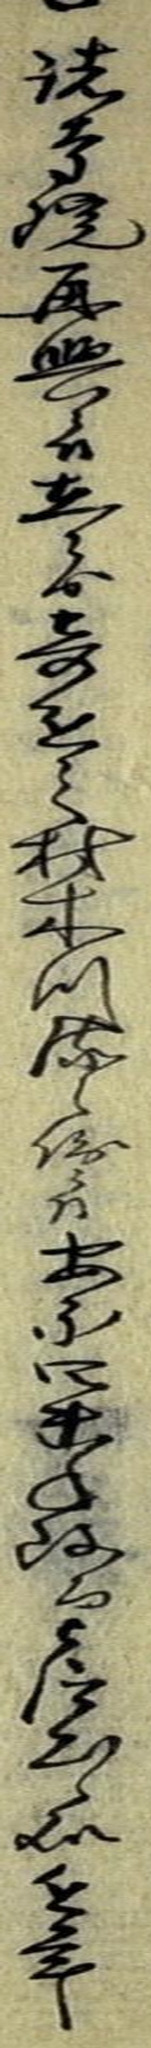〇諸寺院再興ニ付在々ゟ寄進之材木川流之儀ニ付安永四未年改而被仰出候処近年
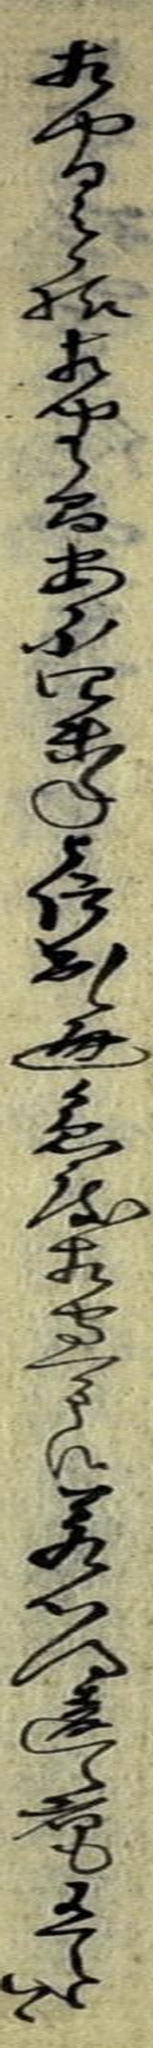相ゆるみ候様相聞候間安永四未年被仰出候通急度相守可申候若心得違之者も有之候ハヽ
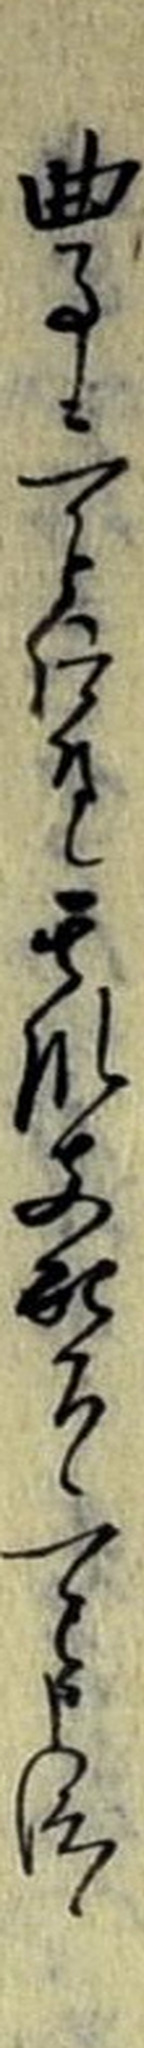曲事ニ可被仰付候其段支配下へ可被申渡候
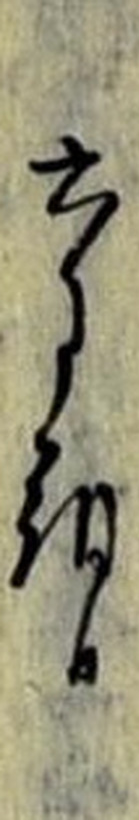六月朔日
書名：命令之部 三
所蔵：福井県文書館 Fukui Prefectural Archives
